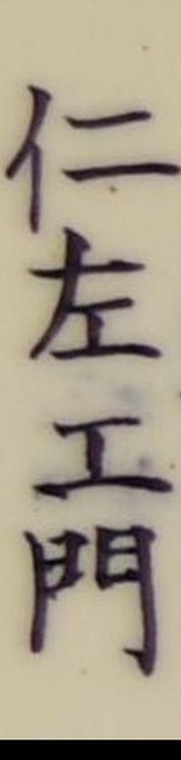仁左衛門
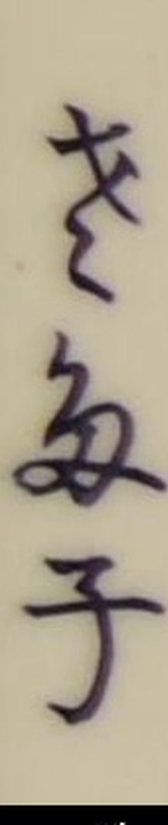さた子

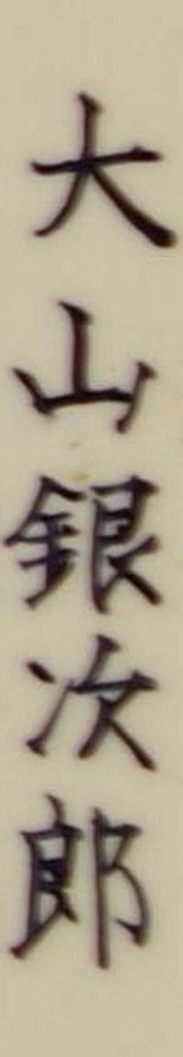大山銀次郎
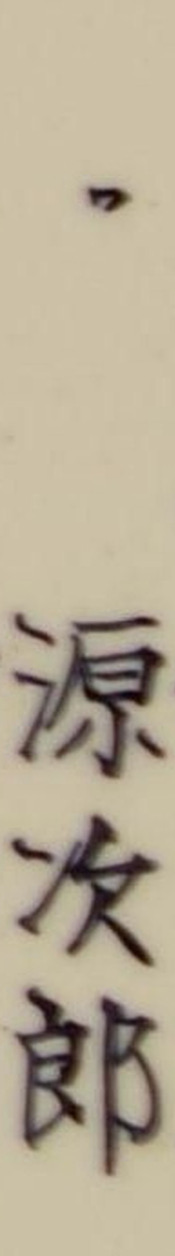源次郎
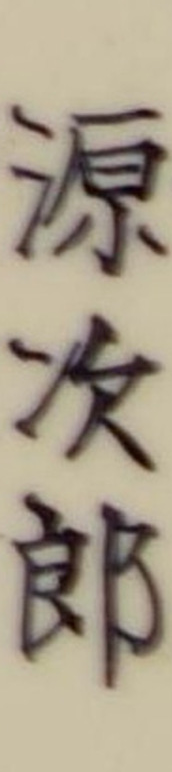源次郎
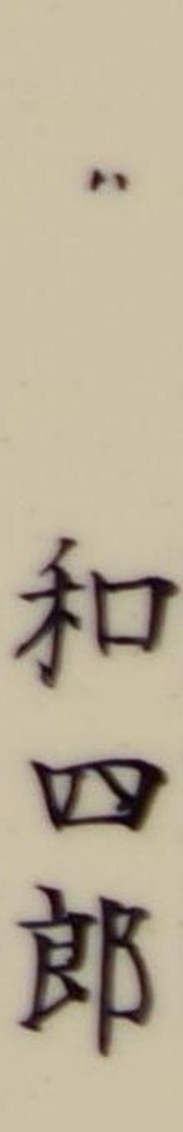和四郎
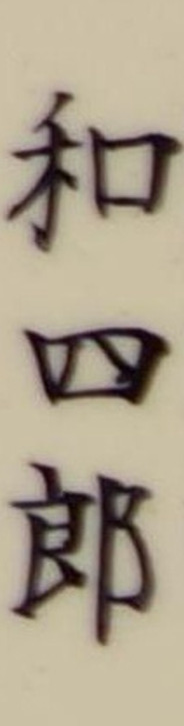和四郎
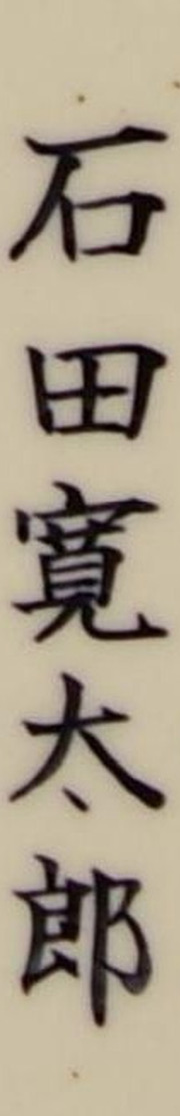石田寛太郎
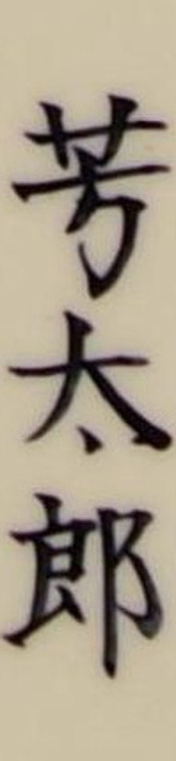芳太郎
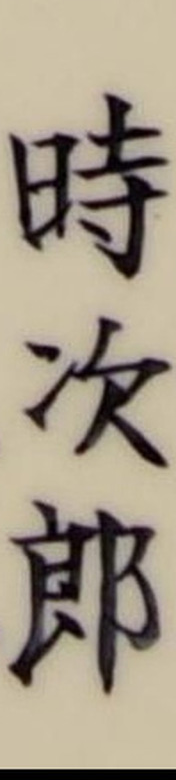時次郎
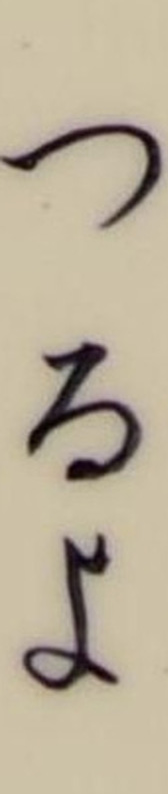つるよ

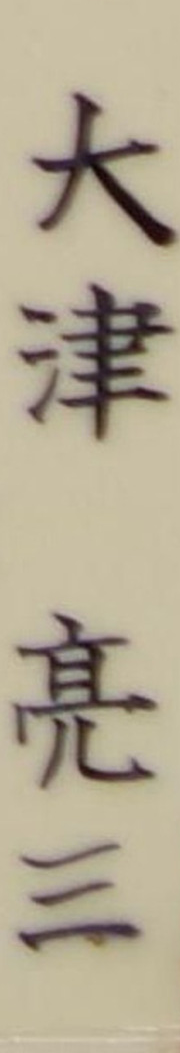大津亮三
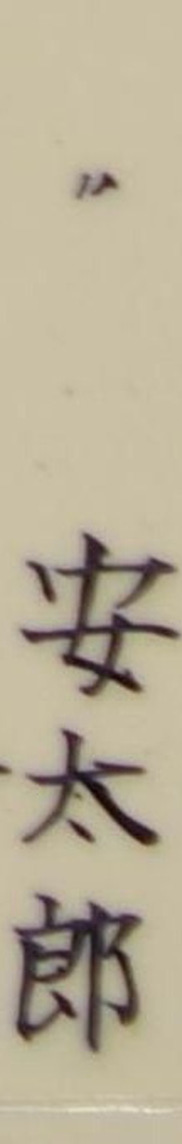安太郎
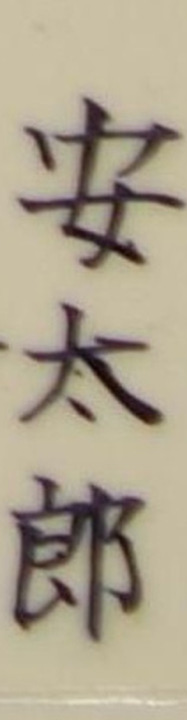安太郎
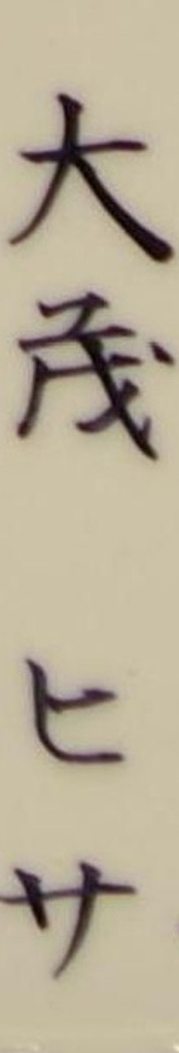大茂ヒサ
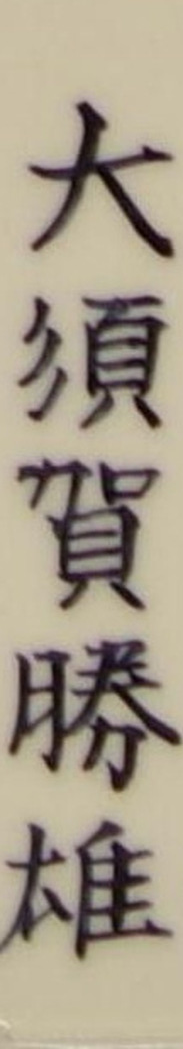大須賀勝雄
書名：E~L
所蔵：高野山金剛峯寺
